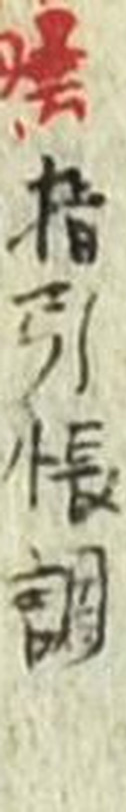指引帳調
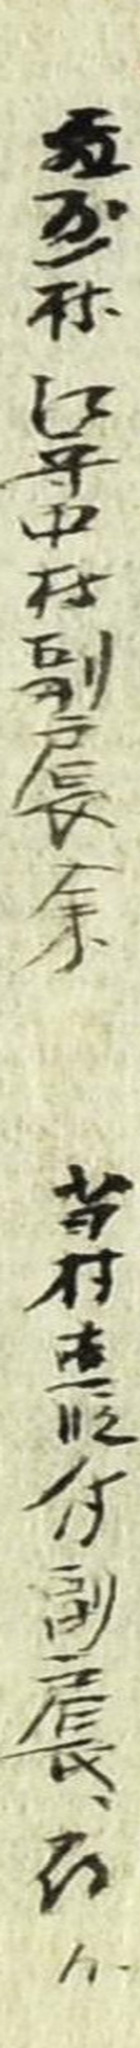舞屋村江守中村副戸長入来当村直段付副戸長へ尋候
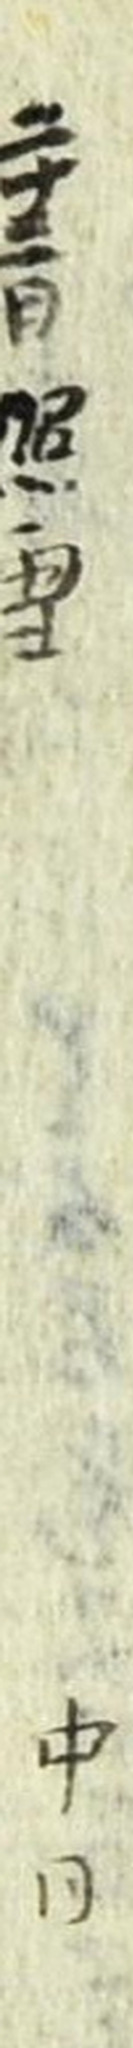二十三日照雪中同
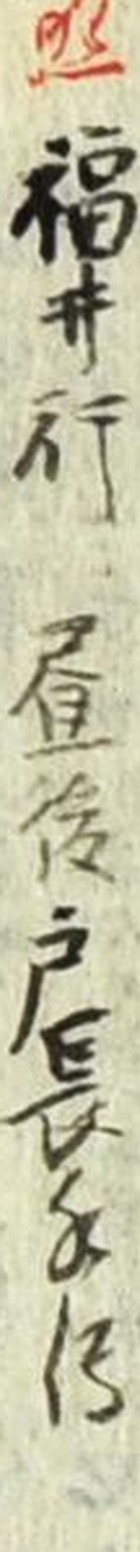福井行昼後戸長手伝
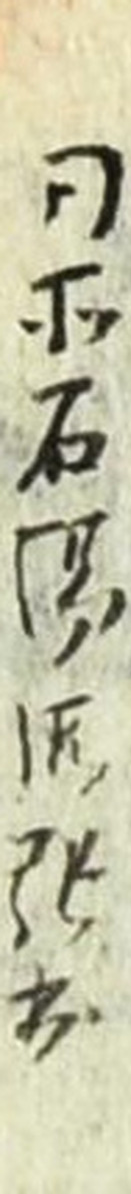同所石場御張出
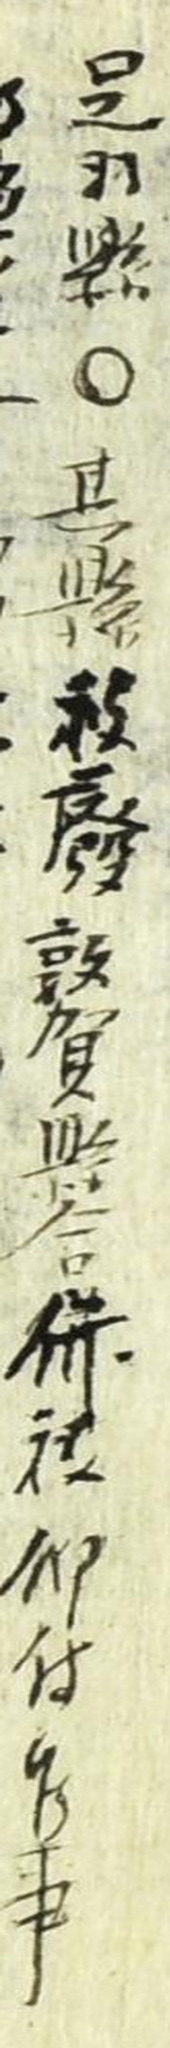足羽県○其県被廃敦賀県合併被仰付候事
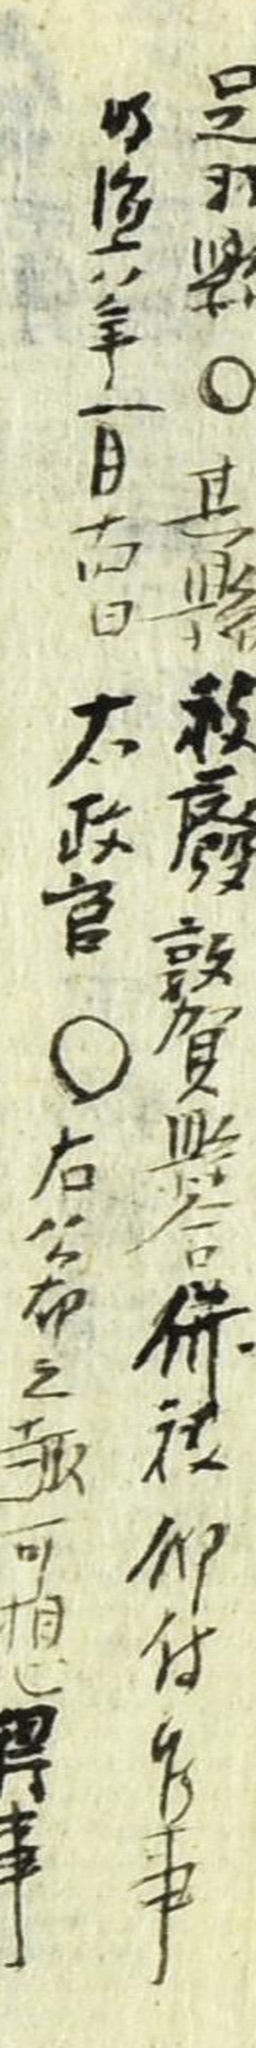明治六年一月十四日太政官○右公布之趣可相心得事
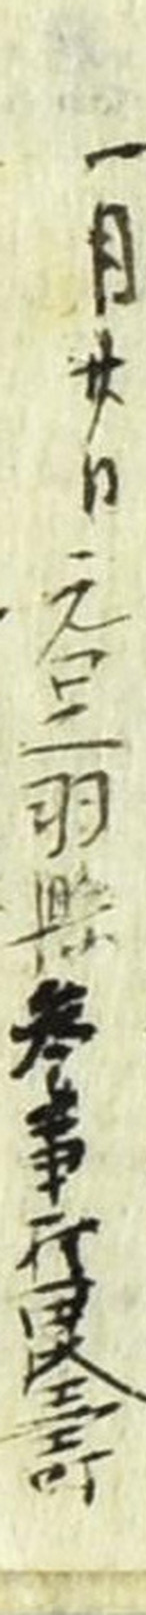一月廿日元足羽県参事村田氏寿

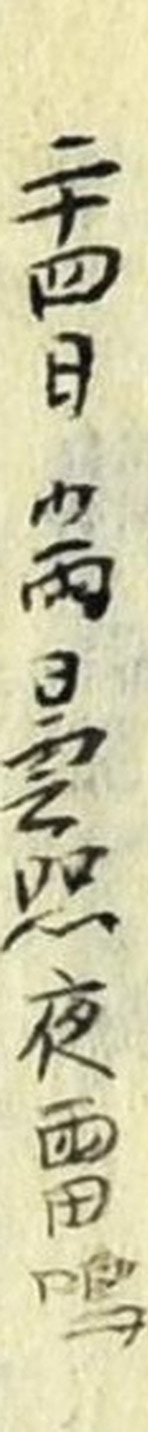二十四日小雨曇照夜雷鳴中鰈
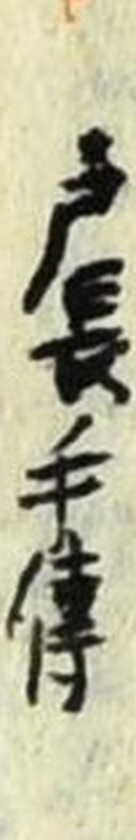戸長手伝
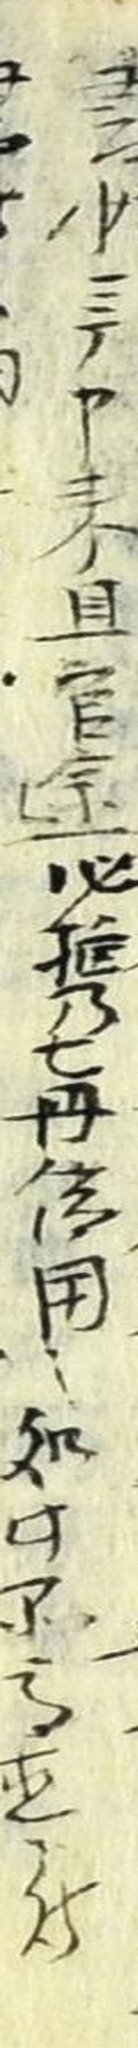書状ニテ申来且官途必携七冊借用之処此品高直ニ付
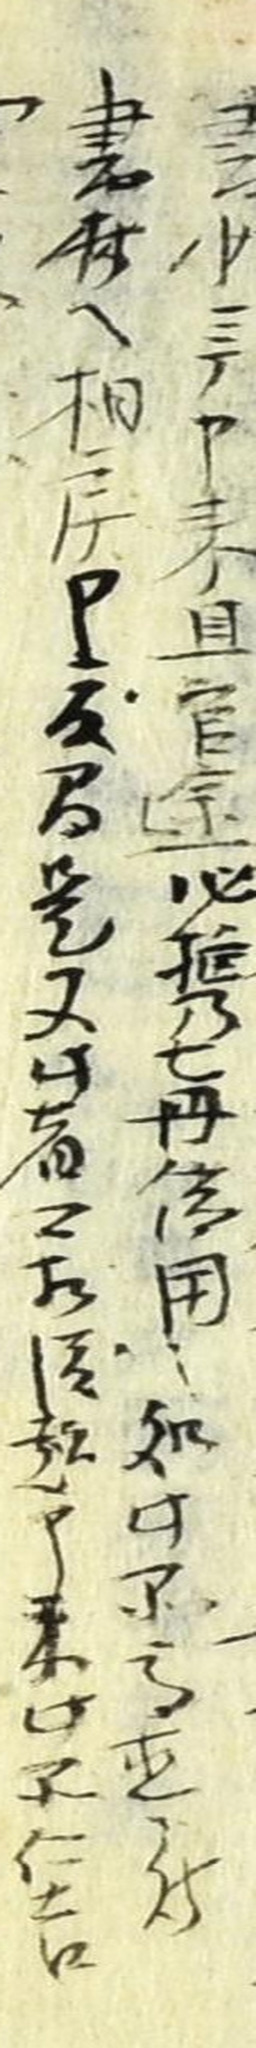書林へ相戻申度間是又此者可相渡趣申来此品仁吉
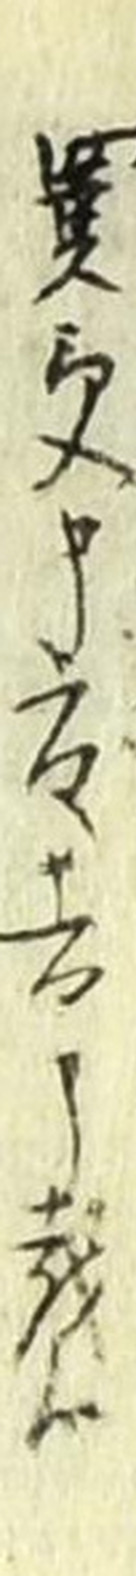買受申度旨申越候
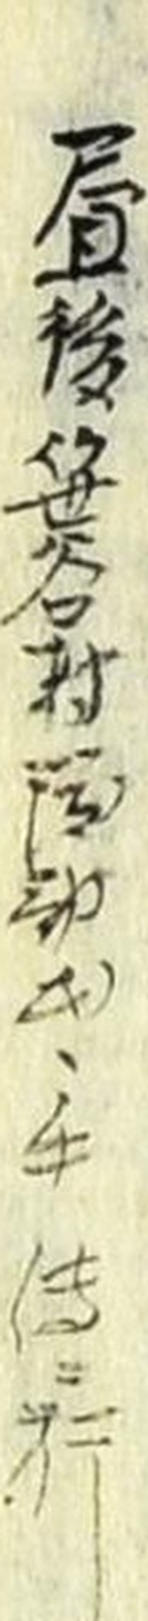昼後笹谷村渡部氏へ手伝ニ行
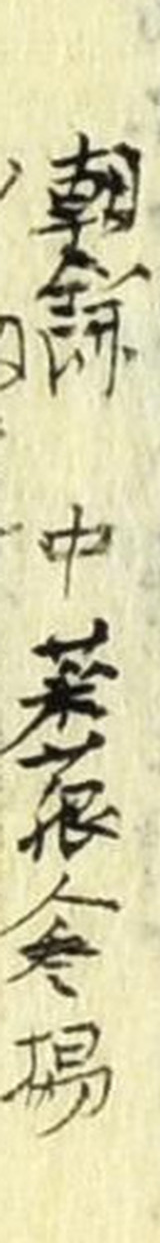朝餅中菜菔人参揚
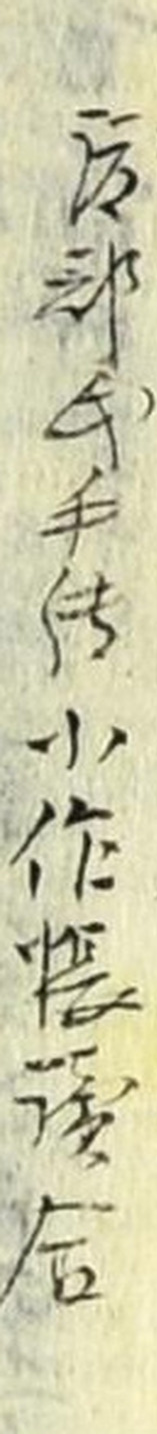渡部氏手伝小作帳読合
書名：（日記）
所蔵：福井県文書館 Fukui Prefectural Archives
